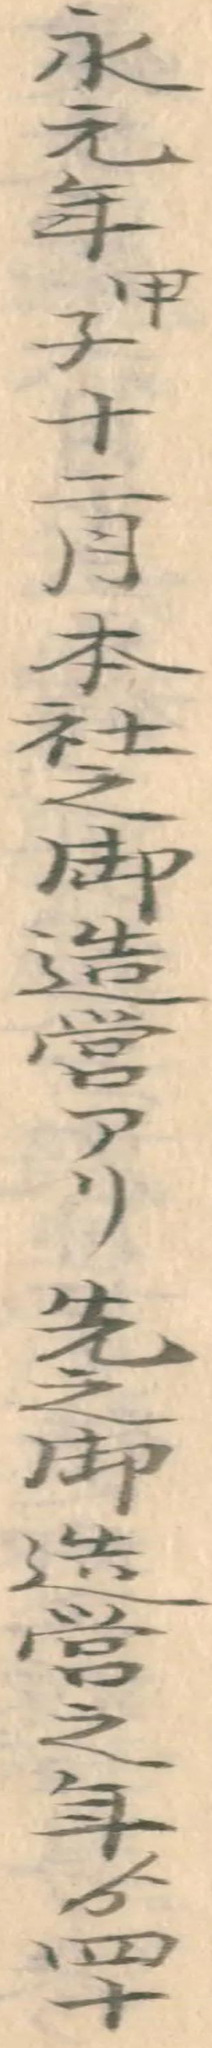永元年甲子十二月本社之御造営アリ先之御造営之年ゟ四十
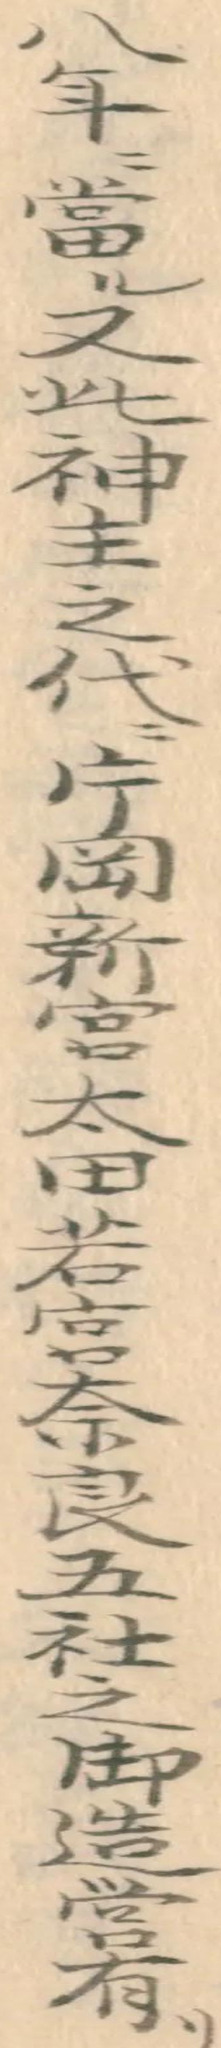八年ニ当ル又此神主之代ニ片岡新宮太田若宮奈良五社之御造営有リ
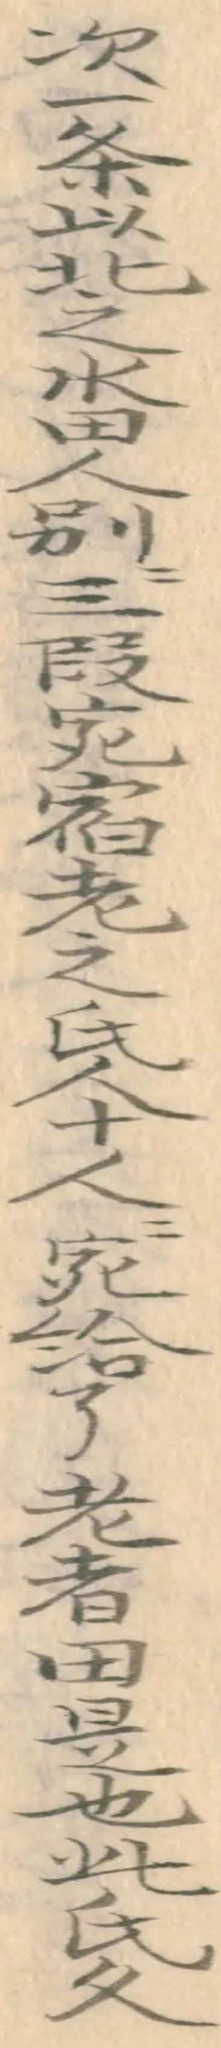次一条此北之水田人別ニ三段宛宿老之氏人十人ニ宛給了老者田是也此氏久
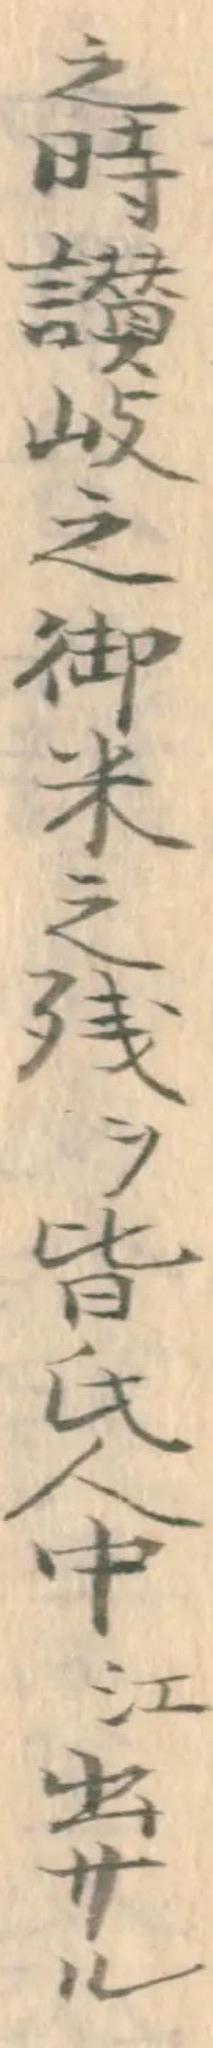之時讃岐之御米之残ヲ皆氏人中江出サル
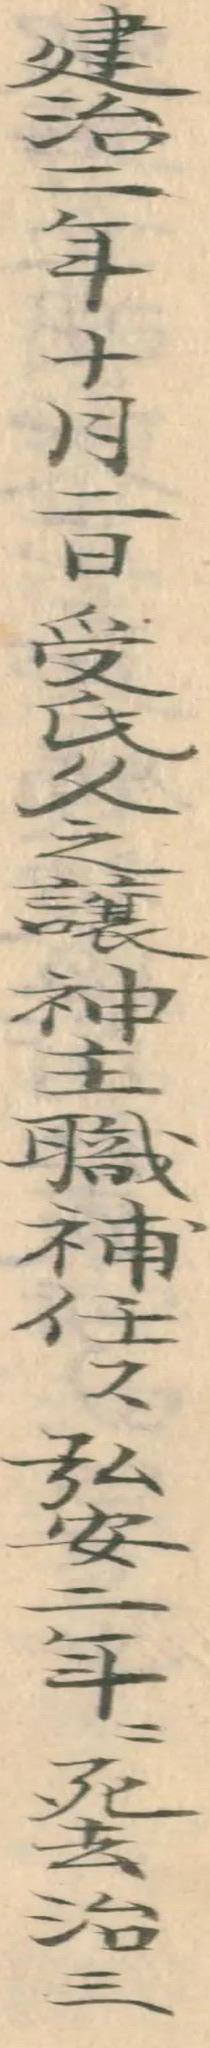建治二年十月二日受氏久之譲神主職補任ス弘安二年ニ死去治三
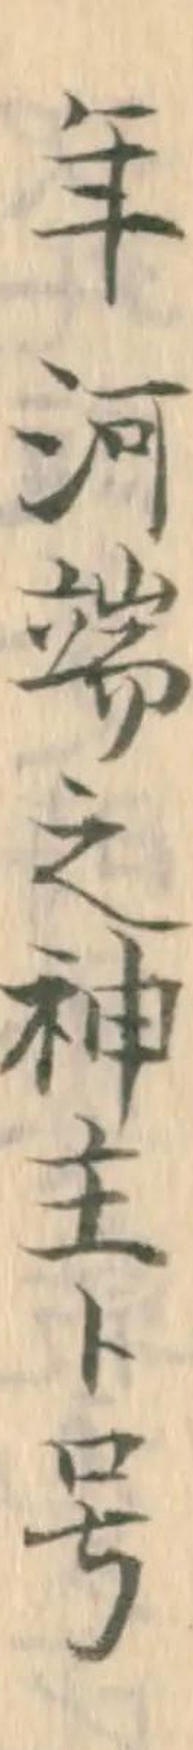年河端之神主ト号
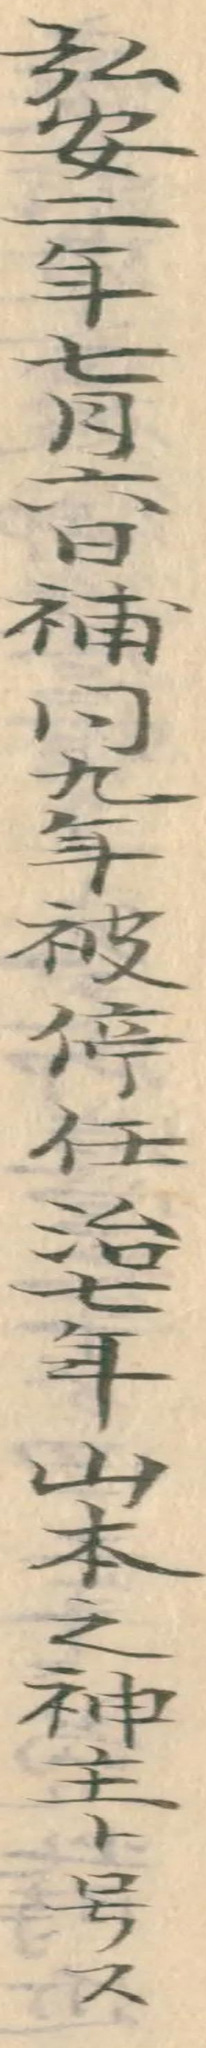弘安二年七月六日補同九年被停任治七年山本之神主ト号ス
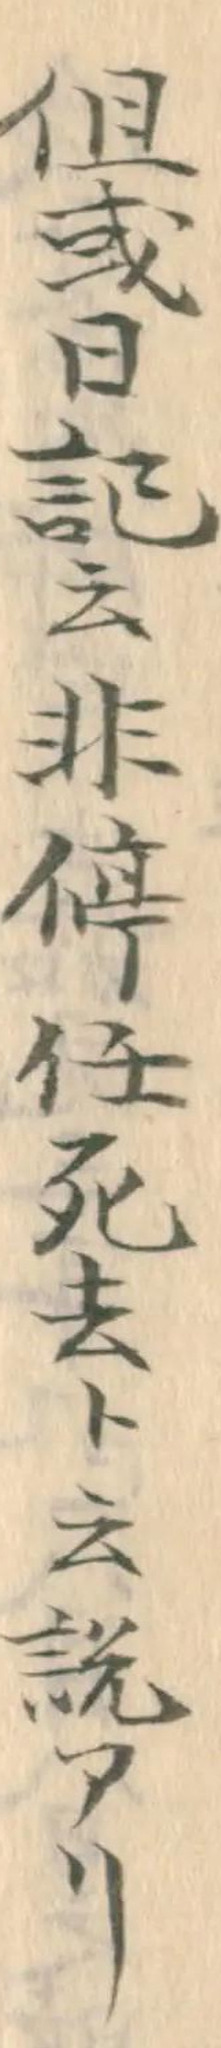但或日記云非停任死去ト云説アリ
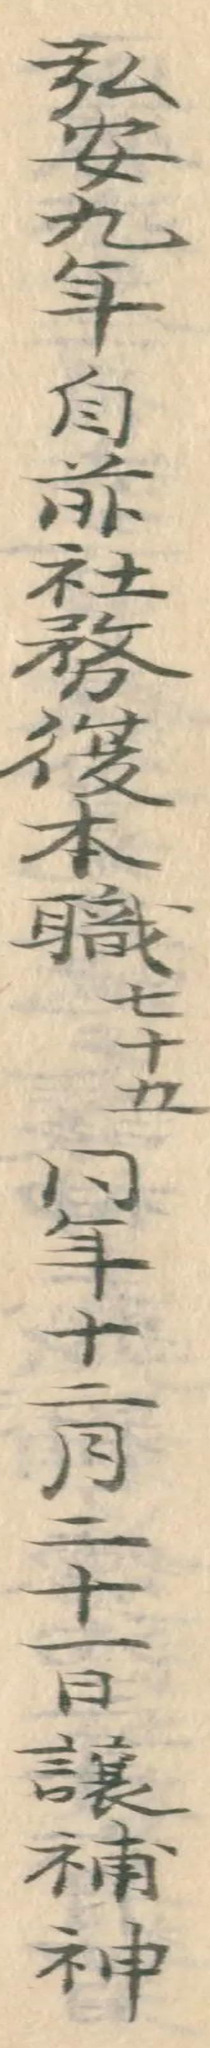弘安九年自前社務復本職七十五同年十二月二十一日譲補神
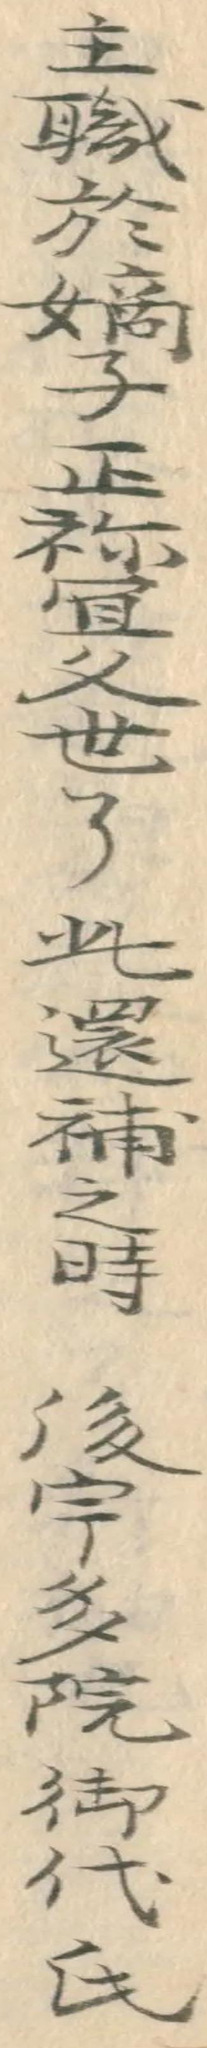主職於嫡子正祢宜久世了此還補之時後宇多院御代氏
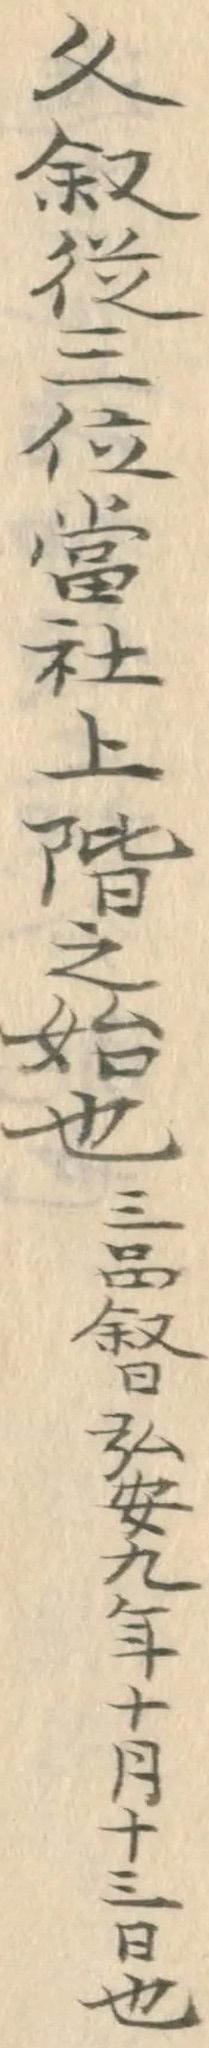久叙従三位当社上階之始也三品叙日弘安九年十月十三日也
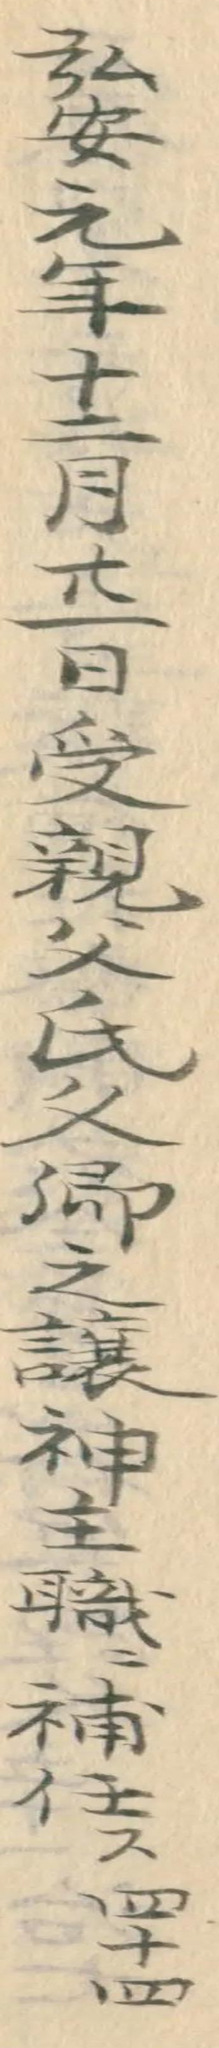弘安元年十二月廿一日受親父氏久卿之譲神主職ニ補任ス四十四

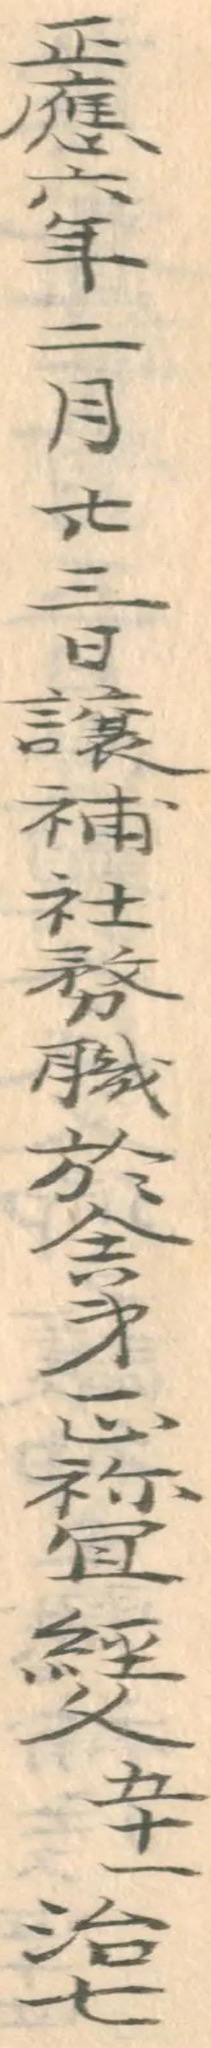正応六年二月廿三日譲補社務職於舎弟正祢宜経久五十一治七
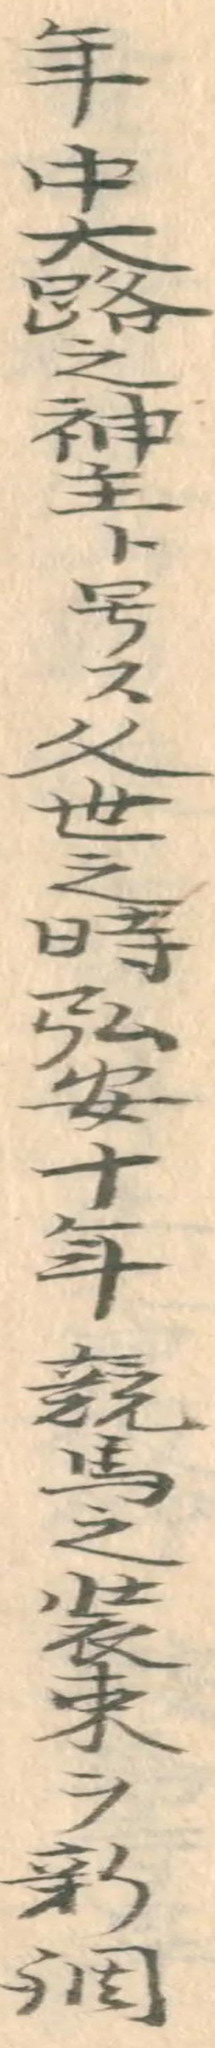年中大路之神主ト号ス久世之時弘安十年競馬之装束ヲ新調
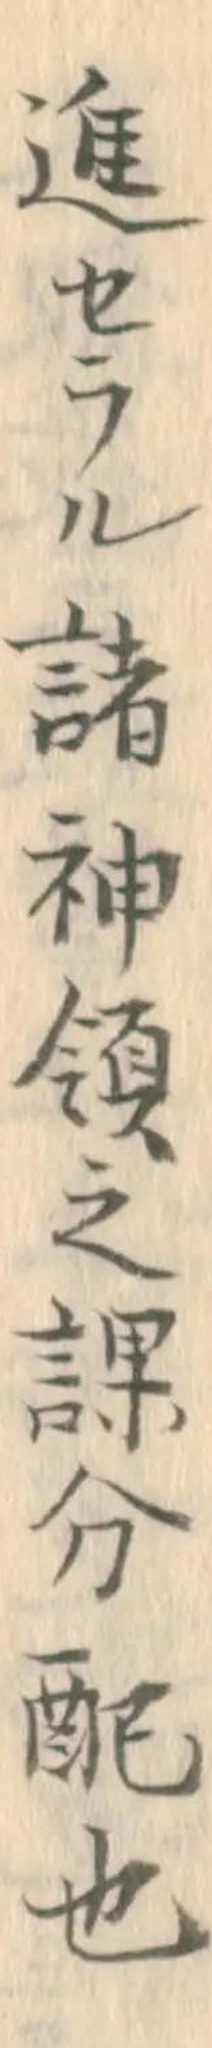進セラル諸神領之課分配也
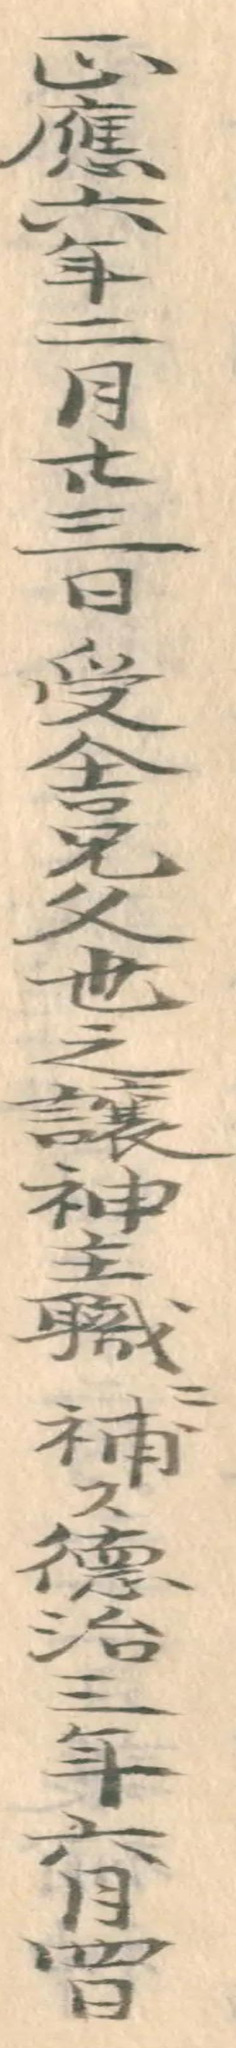正応六年二月廿三日受舎兄久世之譲神主職ニ補ス徳治三年六月四日
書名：賀茂社記録. 第24冊
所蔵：国立国会図書館 National Diet Library, JAPAN
